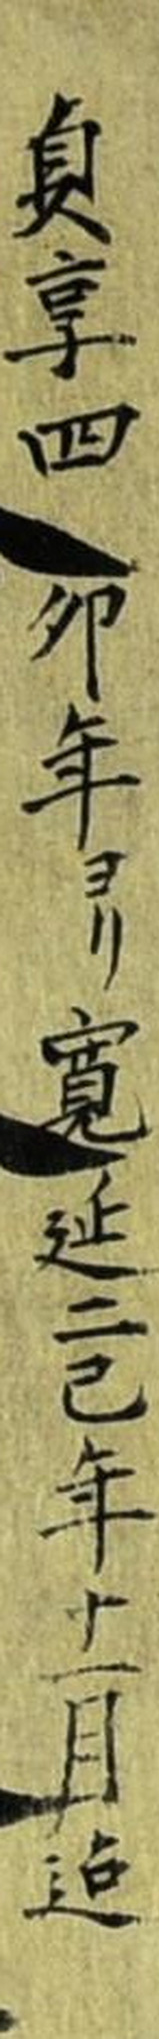貞享四卯年ヨリ寛延二巳年十一月迄

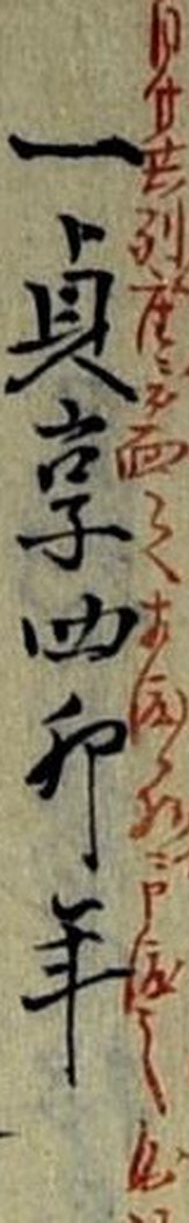一貞享四卯年
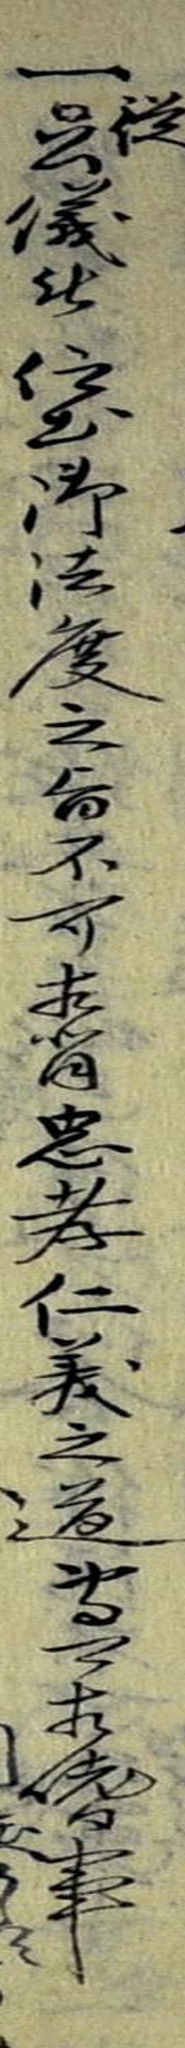一従◦公儀被仰出御法度之旨不可相背忠孝仁義之道専可相嗜事
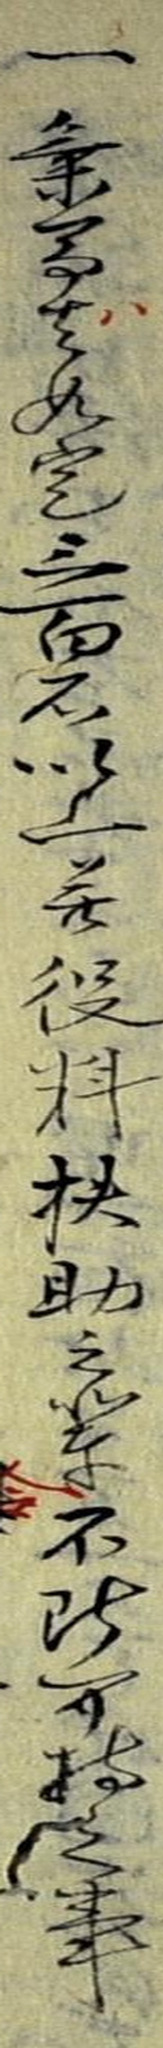一乗馬者如定三百石以上并役料扶助之輩不断可持之事
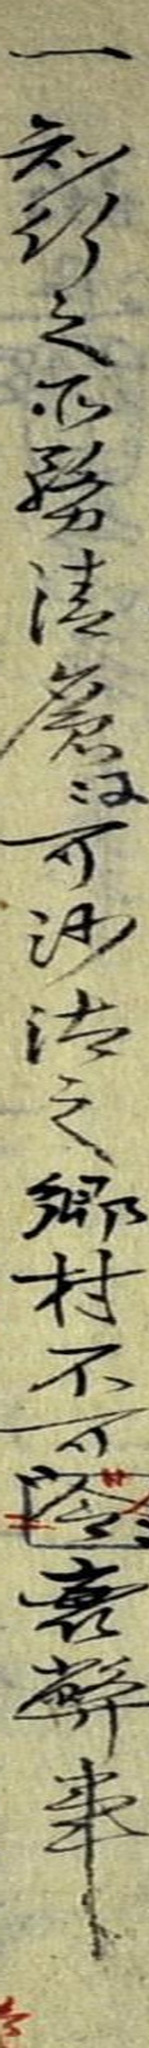一知行之所務清廉ニ可沙汰之郷村不可令衰弊事
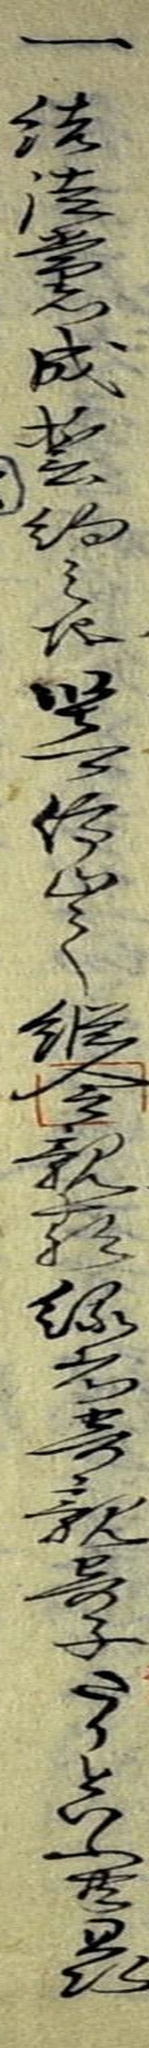一結徒党成誓約之儀堅可停止之縦令令親類縁者寄親寄子たりといふ共贔
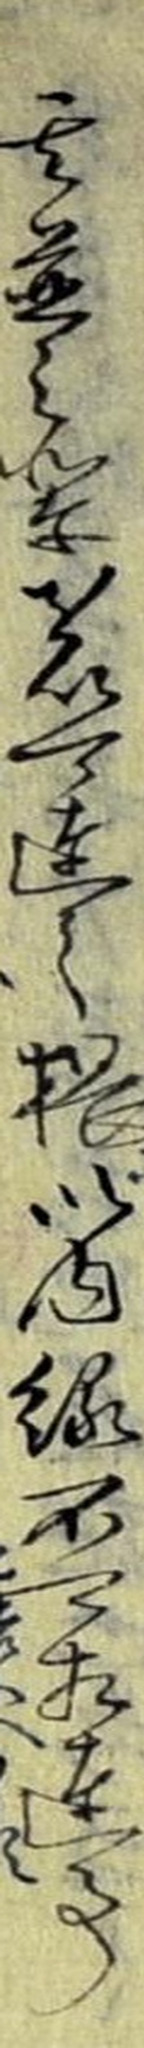其並之輩を以可達之猥尓以内縁不可相達事
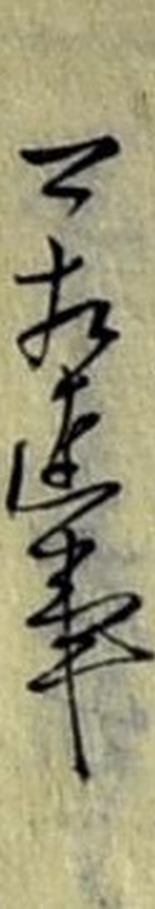可相達事
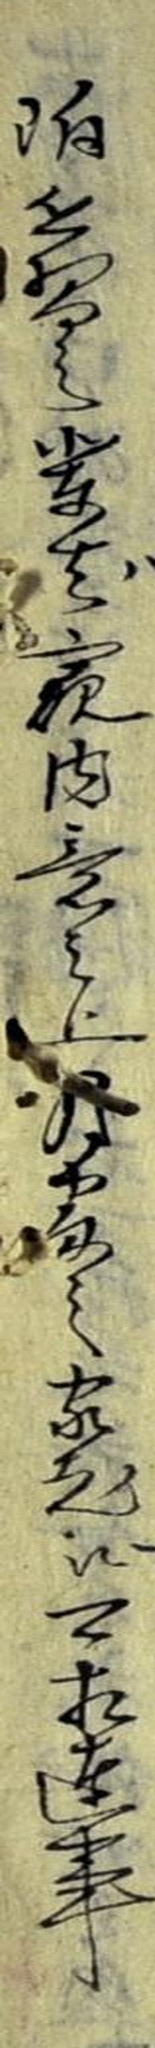附近習之輩者窺内意之上月番之家老江可相達事

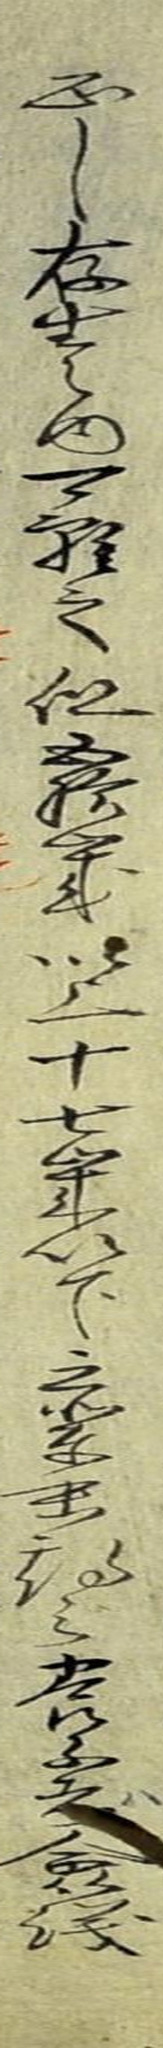正し存生之内可願之但五拾歳以上十七歳以下之輩末期之養子者僉議
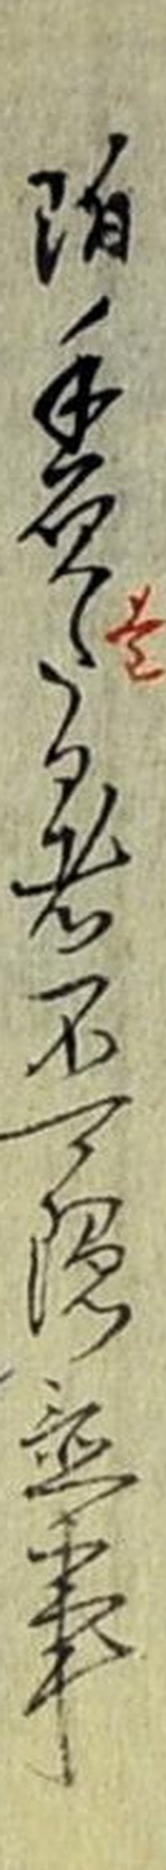附手負たる者不可隠置事
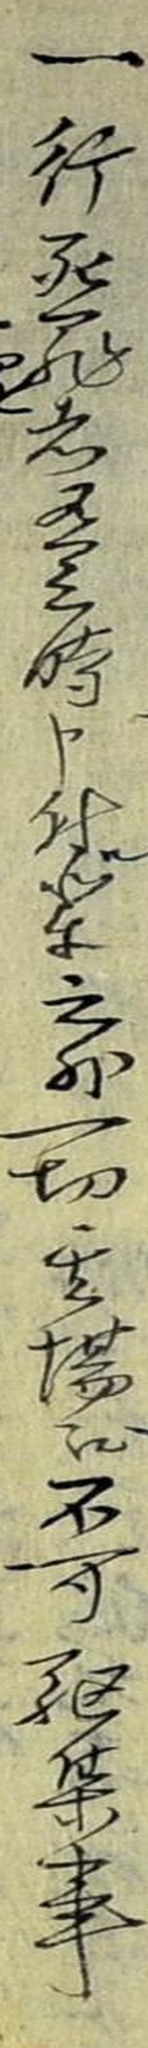一行死罪者有之時申付ル輩之外一切其場江不可駆集事
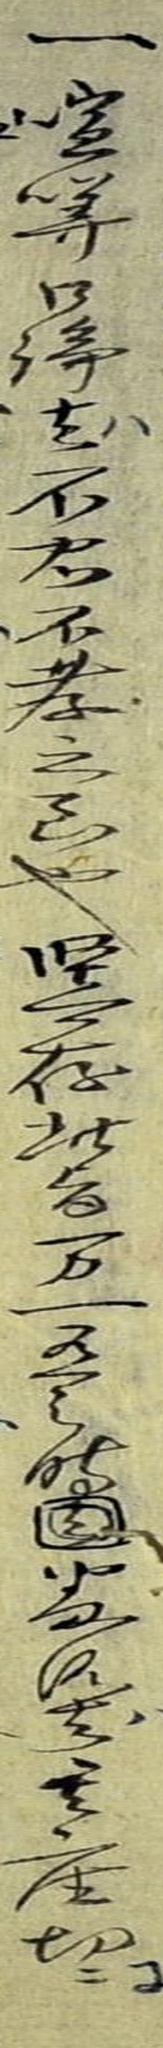一喧嘩口論者不忠不孝之至也堅可存此旨万一有之時者番所者其座切ニ
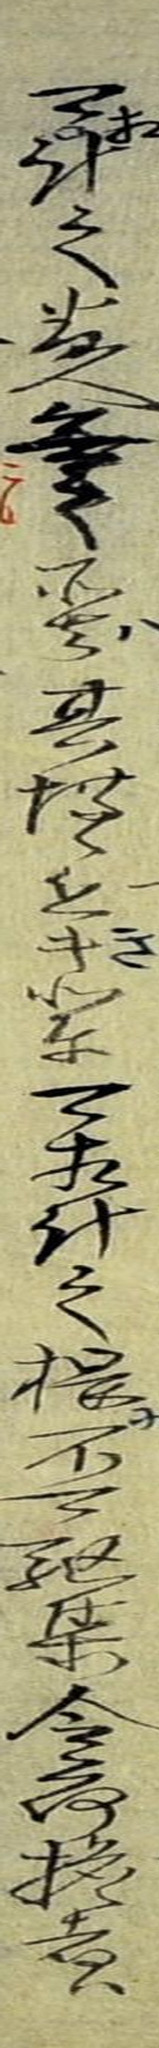可◦相計之番人無之所者其場へ近キ輩可相計之猥尓不可駆集令荷担者ハ
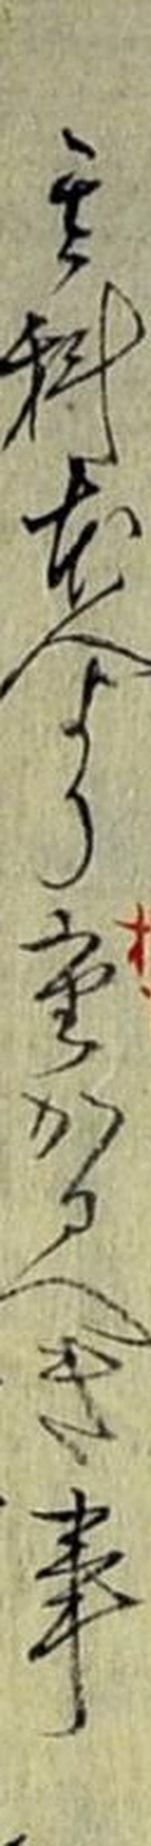其科本人より重かるへき事
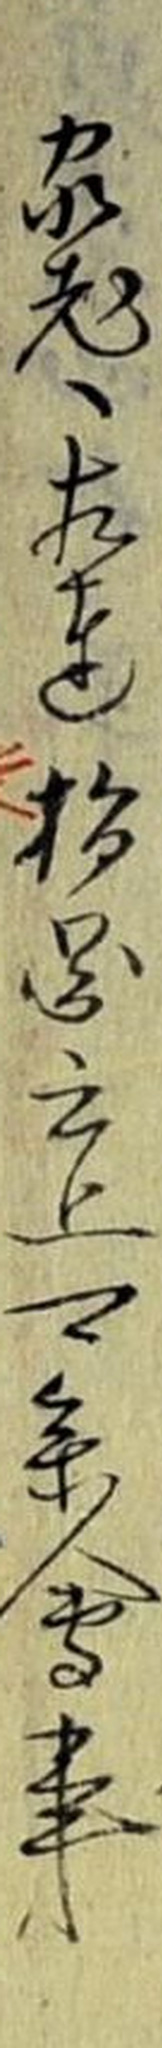家老へ相達指図之上可参会事
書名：命令之部 一
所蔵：福井県文書館 Fukui Prefectural Archives
